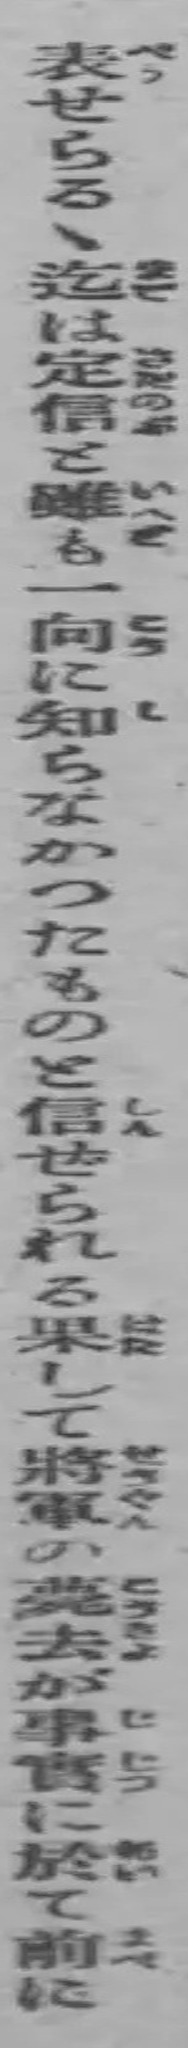表せらるゝ迄は定信と雖も一向に知らなかつたものと信ぜられる果して将軍の薨去が事実に於て前に
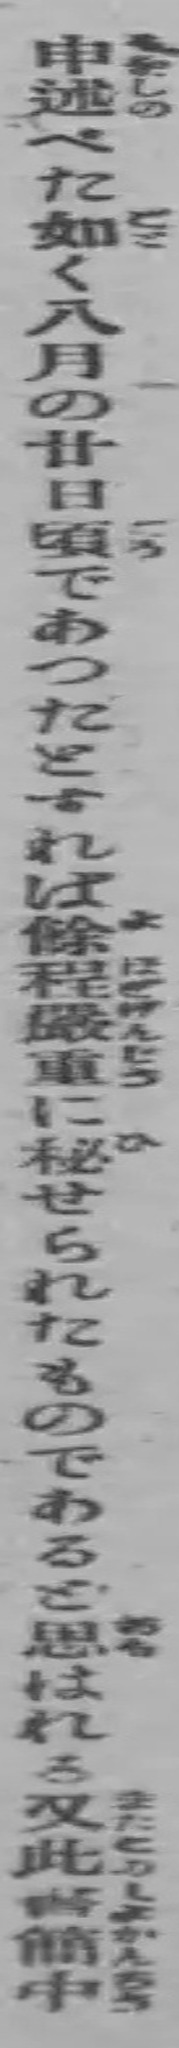申述べた如く八月の廿日頃であつたとすれば余程厳重に秘せられたものであると思はれる又此書簡中
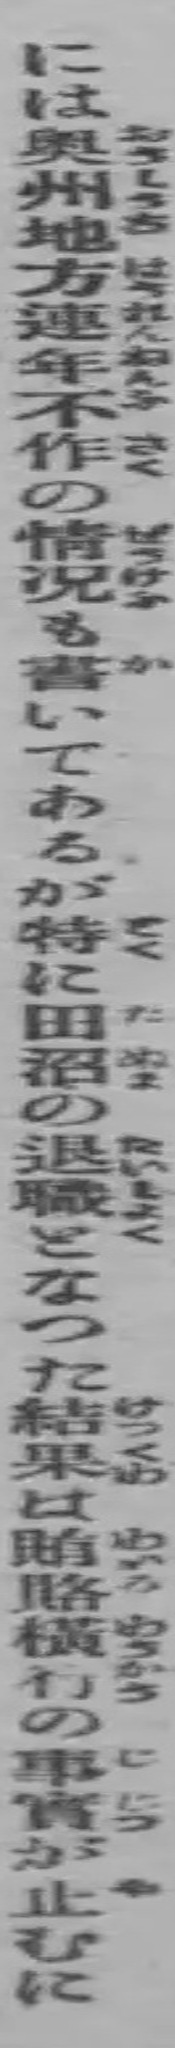には奥州地方連年不作の情況も書いてあるが特に田沼の退職となつた結果は賄賂横行の事実が止むに
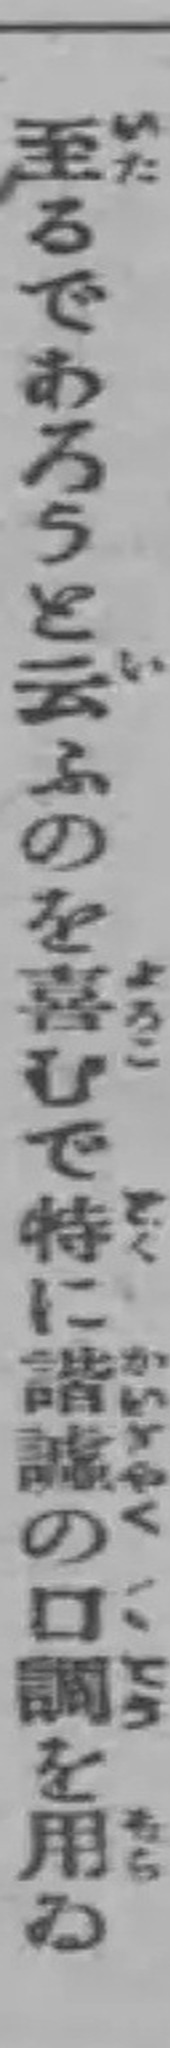至るであろうと云ふのを喜むで特に諧謔の口調を用ゐ
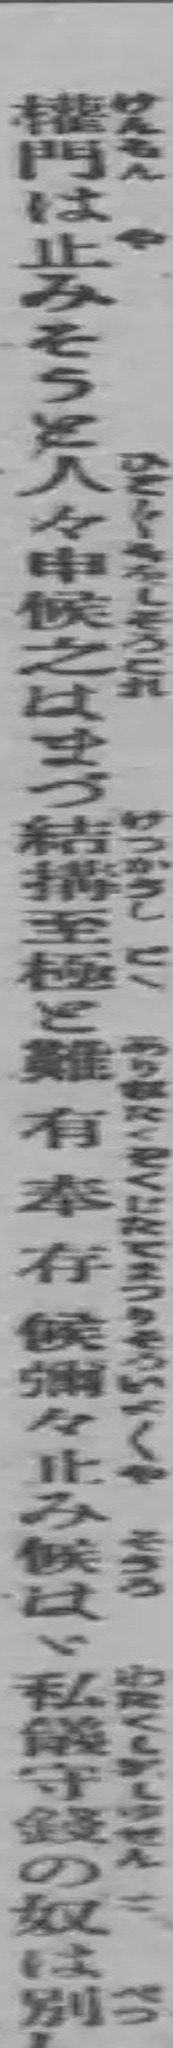権門は止みそうと人々申候之はまづ結構至極と難有奉存候弥々止み候はゞ私儀守銭の奴は別し
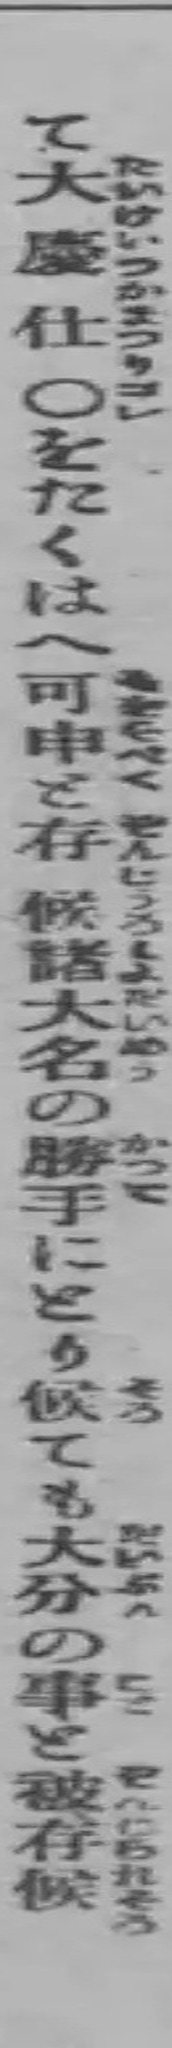て大慶仕○をたくはへ可申と存候諸大名の勝手にとり候ても大分の事と被存候
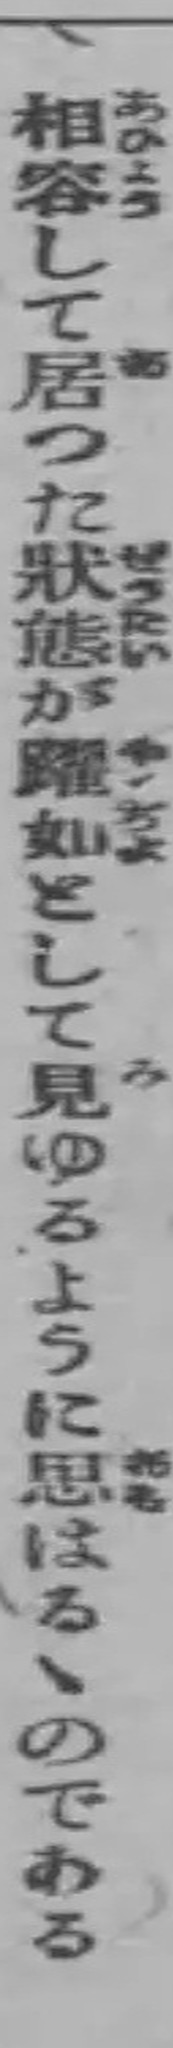相容して居つた状態が躍如として見ゆるように思はるゝのである
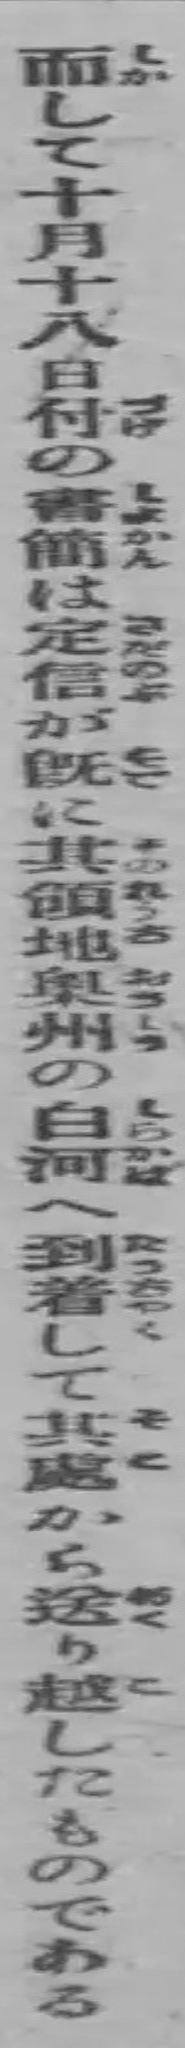而して十月十八日付の書簡は定信が既に其領地奥州の白河へ到着して其処から送り越したものである
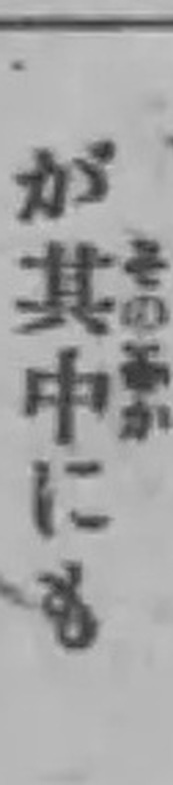が其中にも
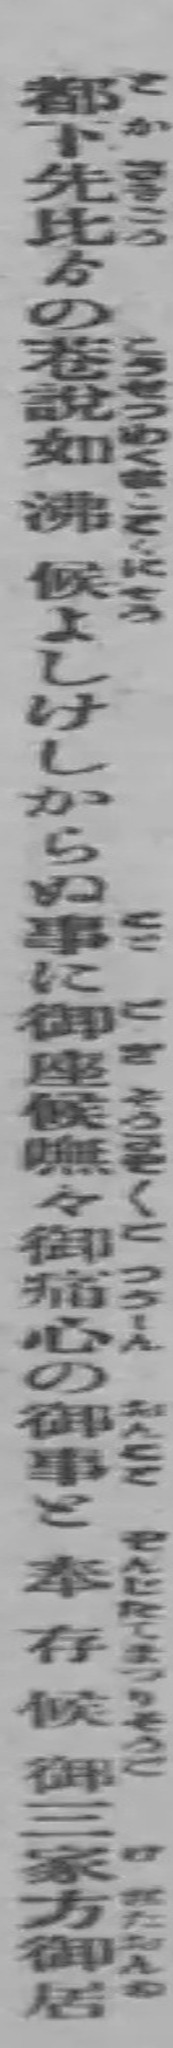都下先比巷説如沸候よしけしからぬ事に御座候嘸々御痛心の御事と奉存候御三家方御居
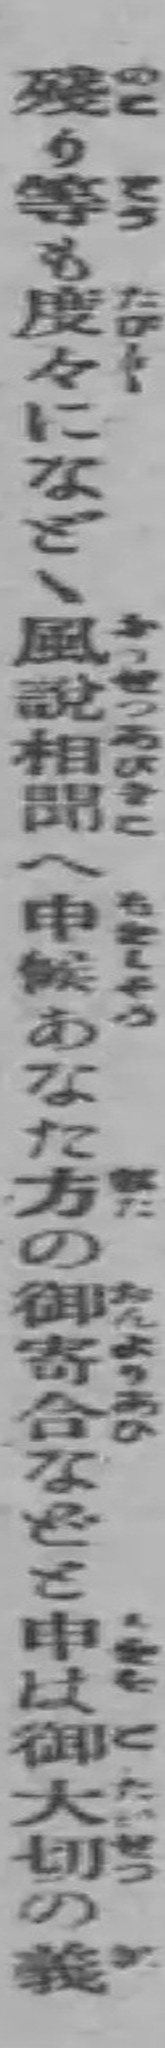残り等も度々になどゝ風説相聞へ申候あなた方の御寄合などと申は御大切の義
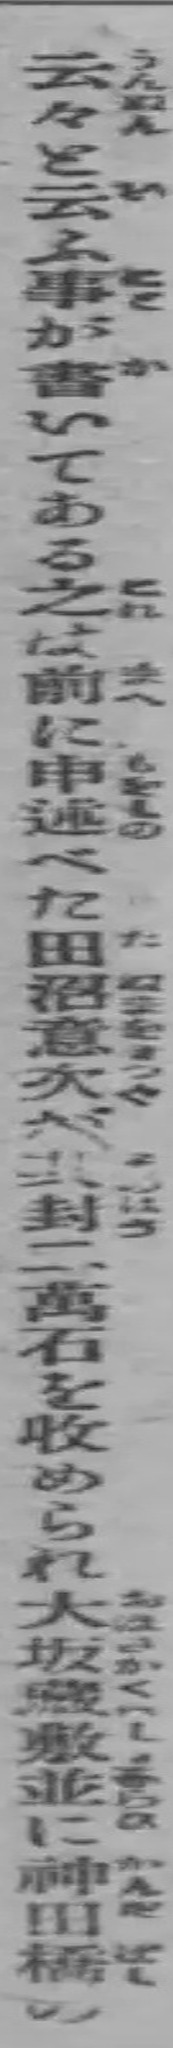云々と云ふ事が書いてある之は前に申述べた田沼意次が其封二万石を収められ大坂蔵敷並に神田橋の

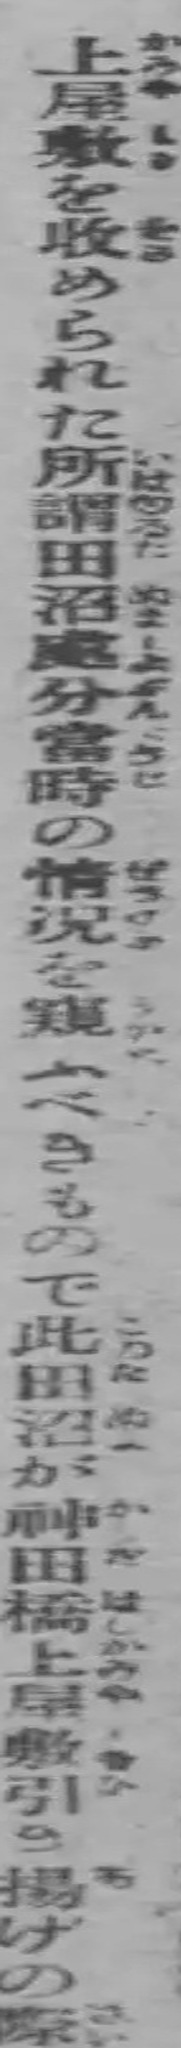上屋敷を収められた所謂田沼処分当時の情況を窺ふべきもので此田沼が神田橋上屋敷引き揚げの際は
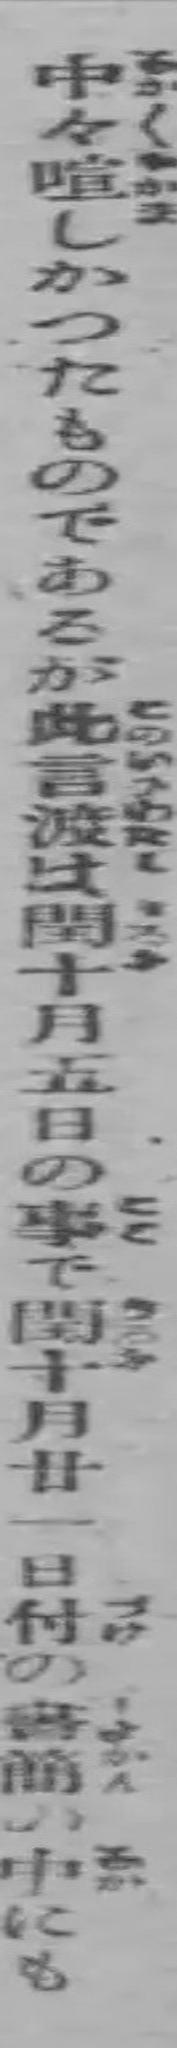中々喧しかつたものであるが此言渡は閏十月五日の事で閏十月廿一日付の書簡の中にも
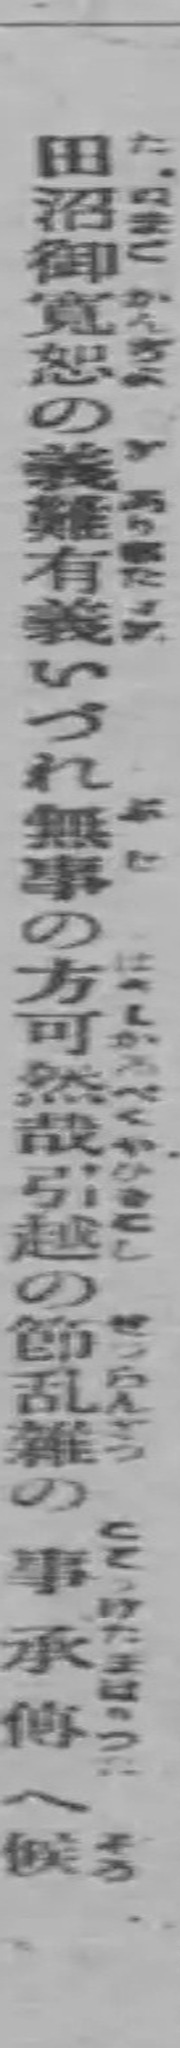田沼御寛怒の義難有義いづれ無事の方可然哉引越の節乱雑の事承伝へ候
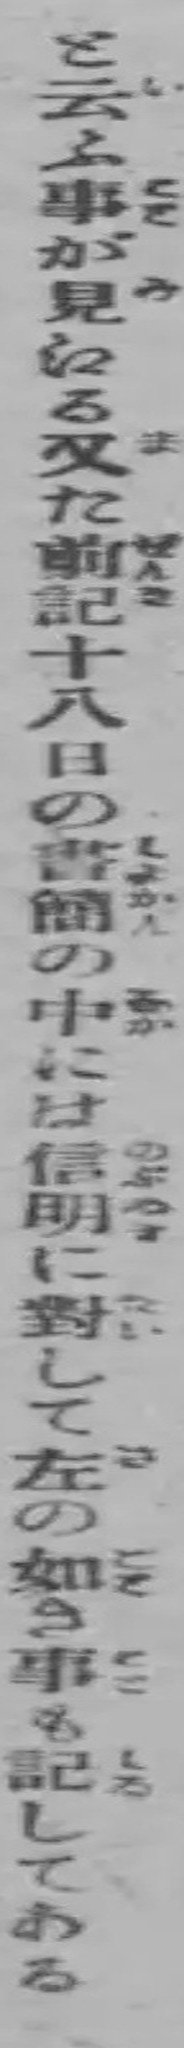と云ふ事が見える又た前記十八日の書簡の中には信明に対して左の如き事も記してある
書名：豊橋市史談
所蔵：国立国会図書館 National Diet Library, JAPAN
